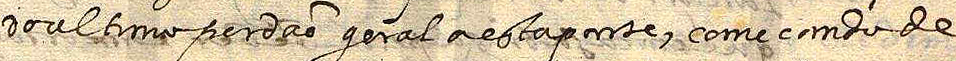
do ultimo perdaõ geral a esta parte, comecando de
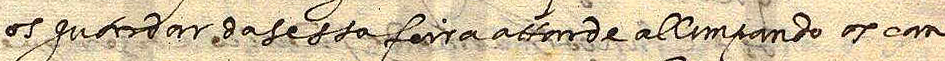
os guardar da sesta feira a ttarde allimpando os can
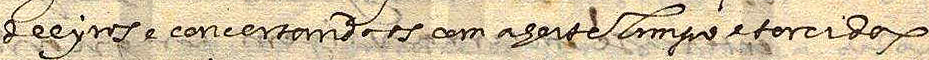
deeyros e concertandoas com azeite limpo e torcidas
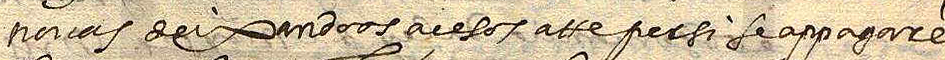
nouas deixandoos açesos atte per si se appagarẽ
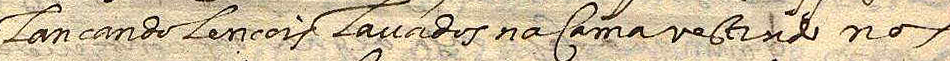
Lancando Lencois Lauados na Cama vestindo nos
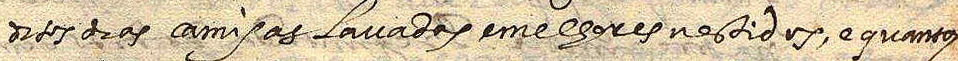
ditos dias camisas Lauadas e melhores uestidos, e quantas
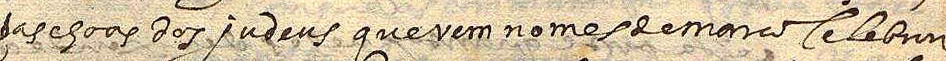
paschoas dos judeus que vem no mes de marco Celebrou
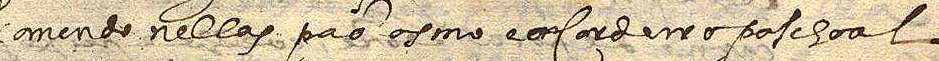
comendo nellas paõ asmo e o Cordeiro paschoal
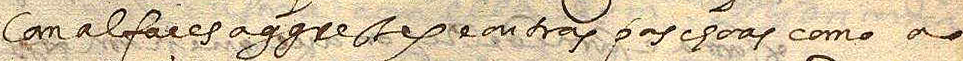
Com alfaçes aggrestes e outras paschoas como a
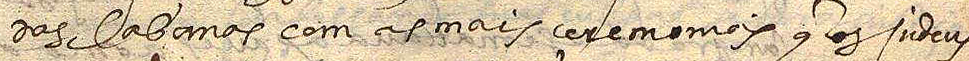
das Cabanas com as mais çeremonias q̄ os judeus
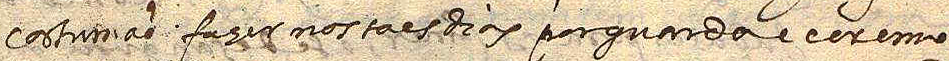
costumaõ fazer nos taes dias por guarda e ceremo
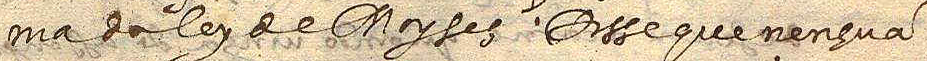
nia da ley de Moyses. Disse que nenhuā
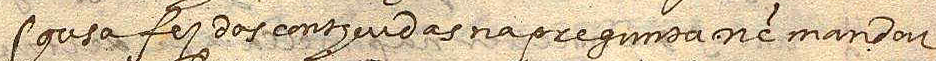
Cousa fez das contheudas na pregunta nẽ mandou
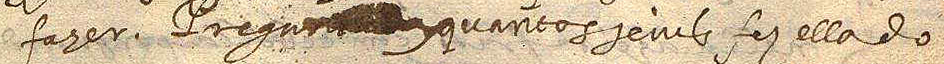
fazer. Pregun___os quantos jeiūs fez ella do
